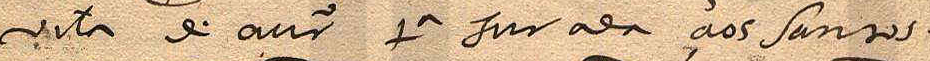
vila de auro ta Jurada aos Santos
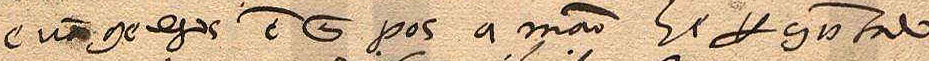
eūagelhos ē q̄ pos a mão he ꝑgūtado
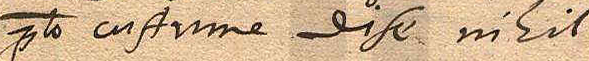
p̄lo custume dise nihil
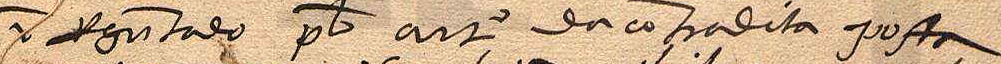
item ꝑgūtado p̄lo arto da c̄otradita posta
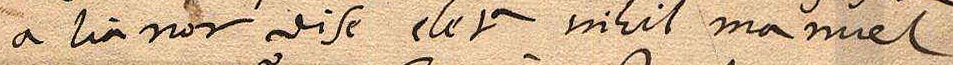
a lianor dise ele ta nihil manuel
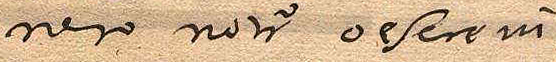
neto notro o escreui
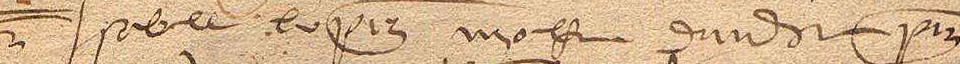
item Jsabell lop̄iz molher dandre p̄iz
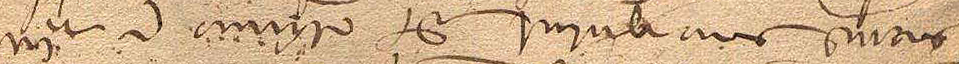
mor ē aueyro tsa jurada aos santos
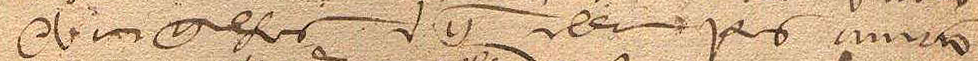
evangelhos ē q̄ ella pos a maõ
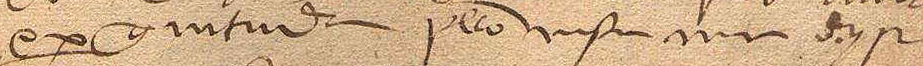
e ꝑguntada pl̄lo custume dyse
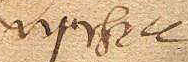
njchyll
